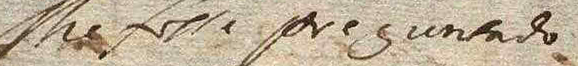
lhe fosse preguntado
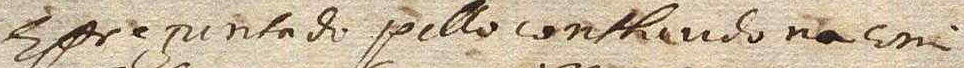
E preguntado pelo contheudo na comi
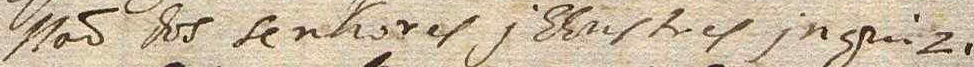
ssão dos senhores jllustres jnquizi
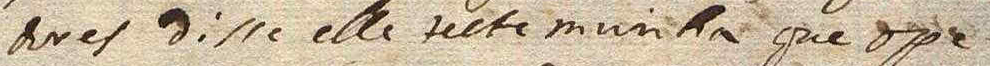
dores disse elle testemunha que o pe
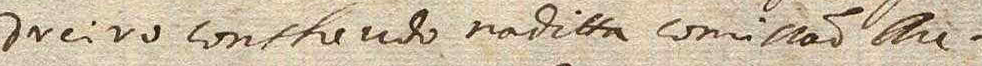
dreiro contheudo na ditta comissão lhe
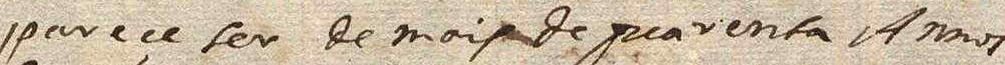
pareçe ser de mais de quarenta Annos
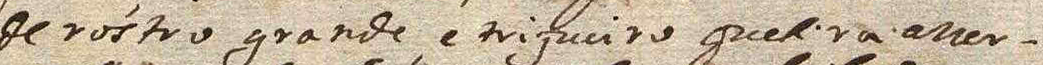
de rostro grande, e trigueiro guelra a uer
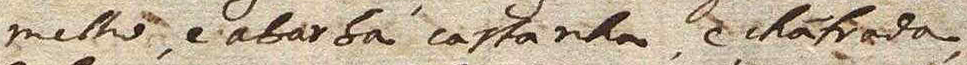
melho, e a barba castanha e chāfrada,
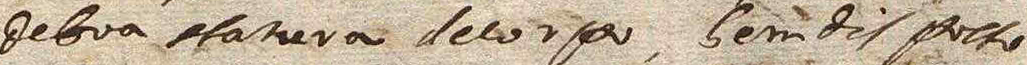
de boa statura de corpo, bem disposto
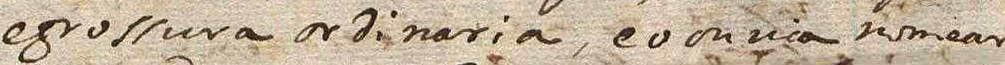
e grossura ordinaria, e o ouuia nomear
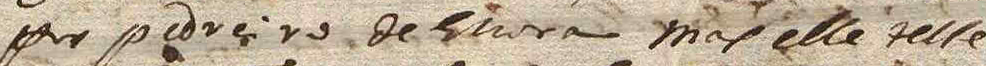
por pedreiro de Euora mas elle teste
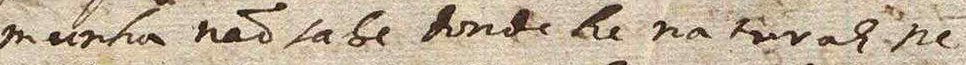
munha naõ sabe donde he natural nē
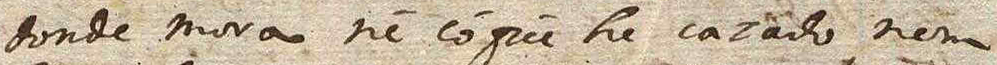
donde mora nē cō quē he cazado nem
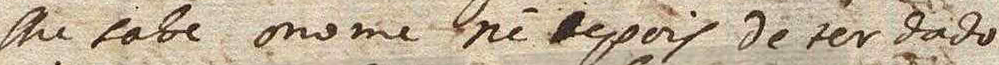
lhe sabe o nome nē depois de ter dado
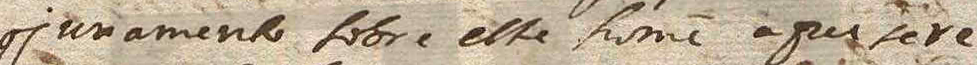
o juramento sobre elle homē a que se re
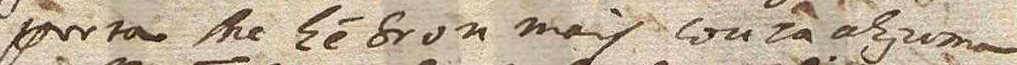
porta lhe lēbrou mais couza alguma
